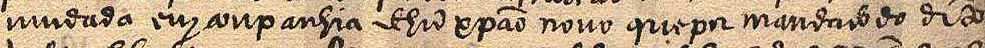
mudada em conpanhia de hū xpão nouo que por mandado do dito
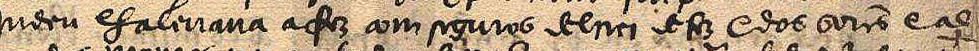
Judeu lha leuaua a fez com seguros del rrei de fez e dos sores̄ e al
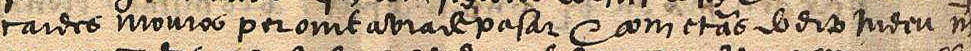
caides mouros per omde avia de pasar e com ctās do dito Judeu mt
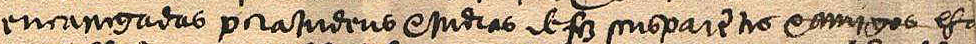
encarregadas pera Judeus e Judias de fez seus parētes e amjgos lha
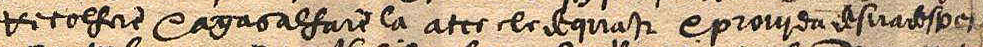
Recolherē e agasalharē la atee ele de qua Jr e proujda de sua despe
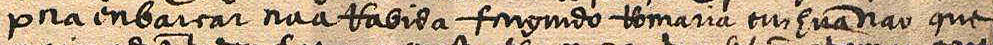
pera enbarcar na aRabida fengindo Romaria em huā nao que
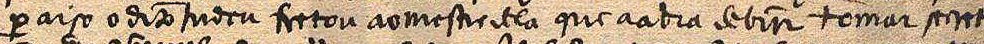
ꝑa iso o dito Judeu fretou ao mestre dela que a avia de vijr tomar secret
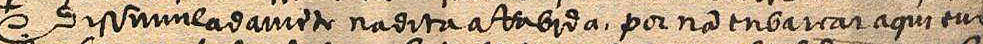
e dissimuladamēte na dita aRabjda, por nā enbarcar aqui em
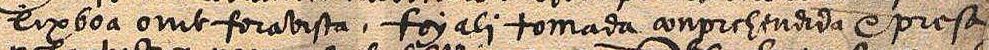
lixboa onde fora vista . foy alj tomada conprehendida e presa
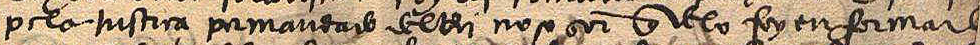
pela Justiça per mandado del Rej noso sor̄ q̄ delo foy enformad
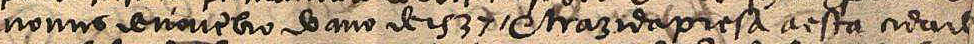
no mes de nouēbro do ano de i537 / e trazida presa a esta cidad
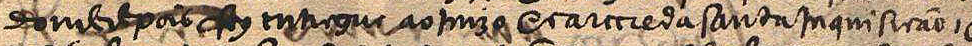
donde depois foy entregue ao Juiz e carcere da santa Jnquisição /
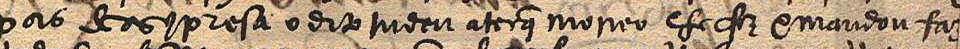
pois de asy presa o dito Judeu atee q̄ morreo lhe fez e mandou faz
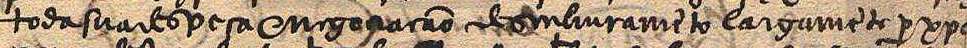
toda sua despesa e negociação de seu liuramēto largamēte ꝑ xp
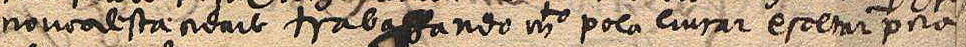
nouos desta cidade trabalhando mto pola liurar e soltar pera
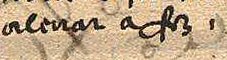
a leuar a fez .
